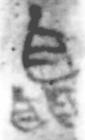聶（攝）
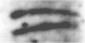二
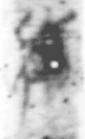紫
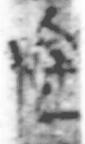○（錦）
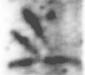之
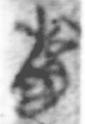○（箙）
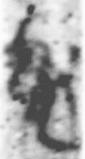○（豻）
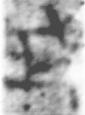○（飾）
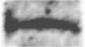一
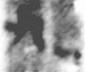九
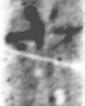矢
